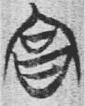○（答）
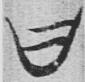曰
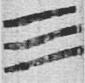三
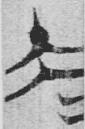大
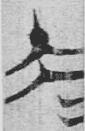夫
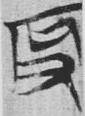辱
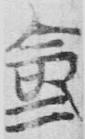命
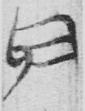於
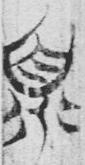○（寡）
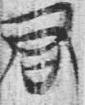君
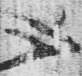之
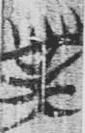菐（僕）
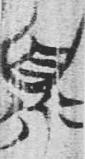○（寡）
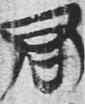君
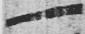一
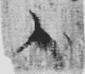人
